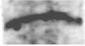一
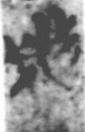○（戟）
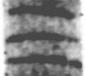三
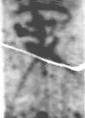果（戈）
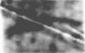一
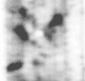之
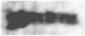一
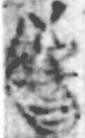晉
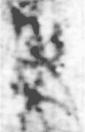杸
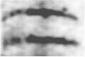二
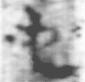屯
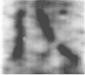八
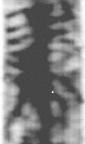翼
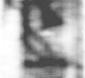之
